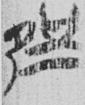○（強）
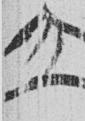立
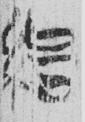○（治）
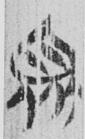衆
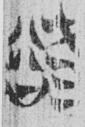欲
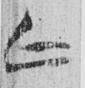㠯（以）
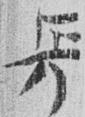長
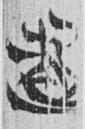○（建）
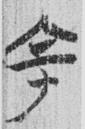宔（主）
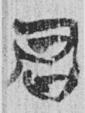君
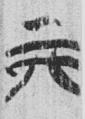而
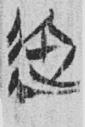○（御）
